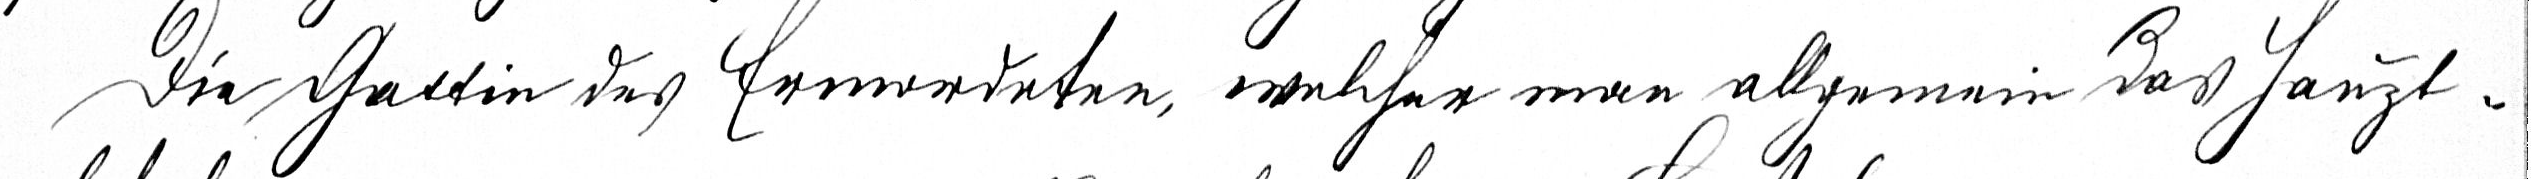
Die Gattin des Ermordeten, welcher man allgemein das Haupt¬
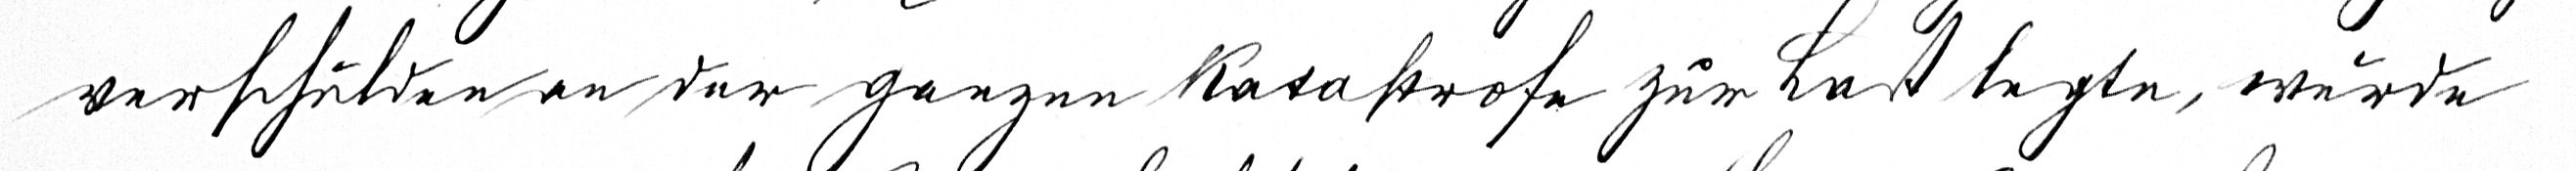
verschulden an der ganzen Katastrofe zur Last legte, wurde
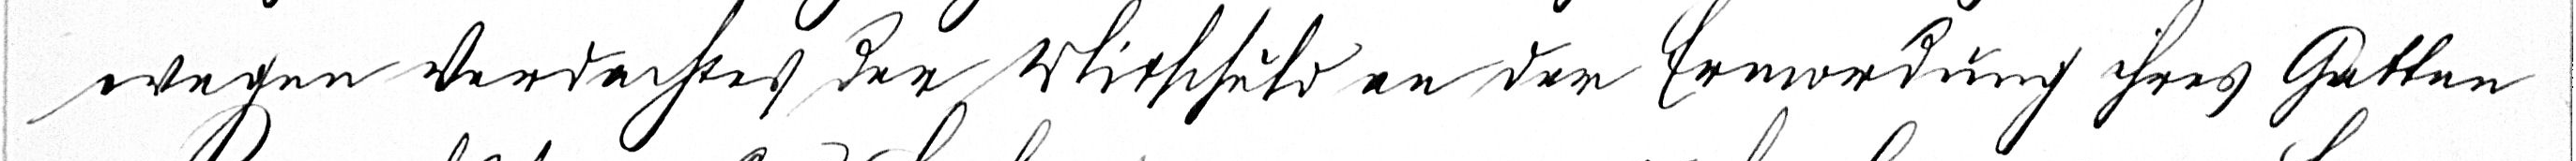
wegen Verdachtes der Mitschuld an der Ermordung ihres Gattan
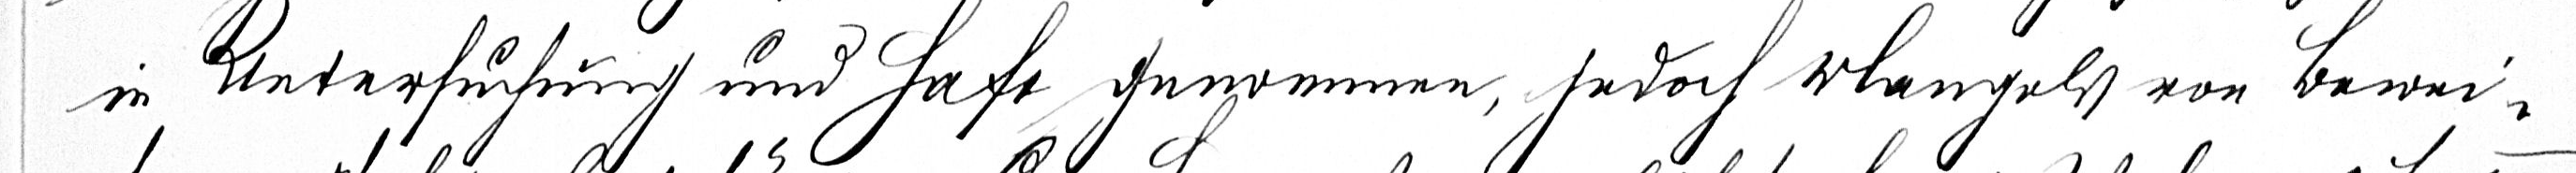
in Untersuchung und Haft genommen, jedoch Mangels von Bewei¬
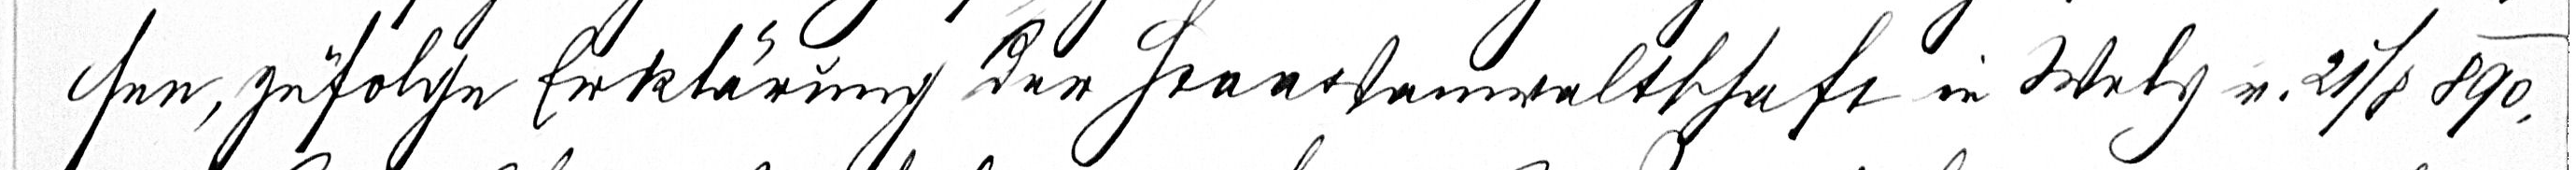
sen, zufolge Erklärung der Hxxanwaltschaft in Wely v. 21/8 890.
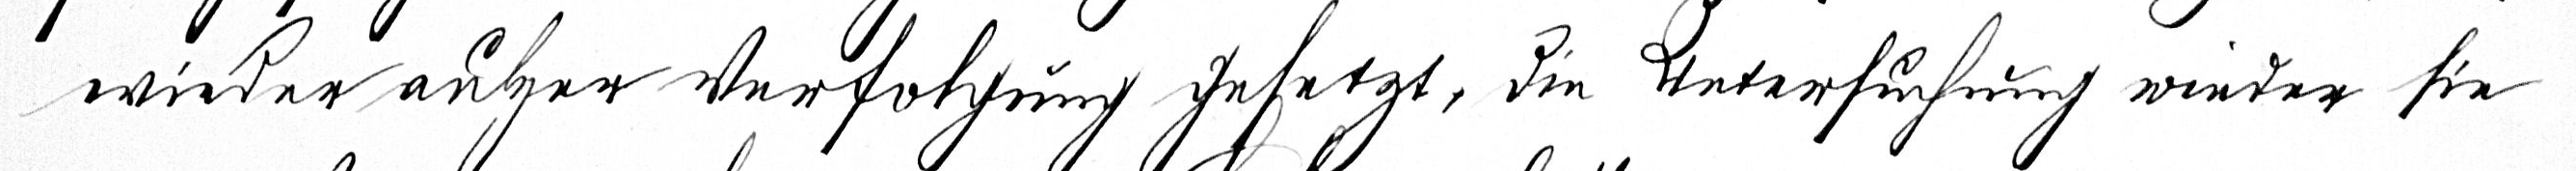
wieder außer verfolgung gesetzt, die Untersuchung wieder sie
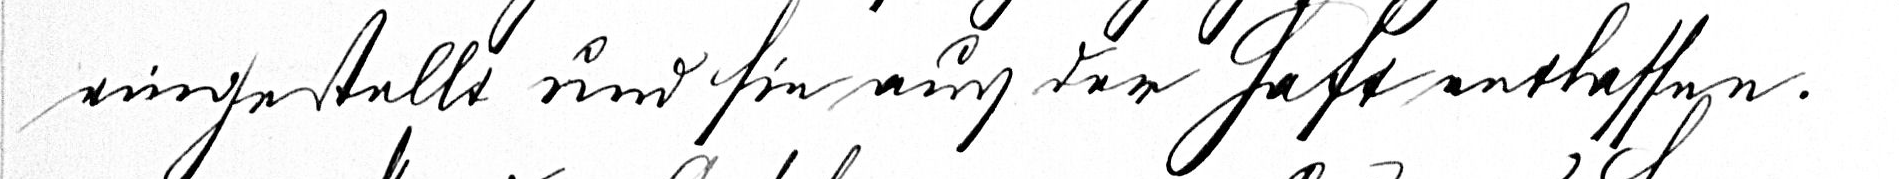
eingestellt und sie aus der Haft entlassen.
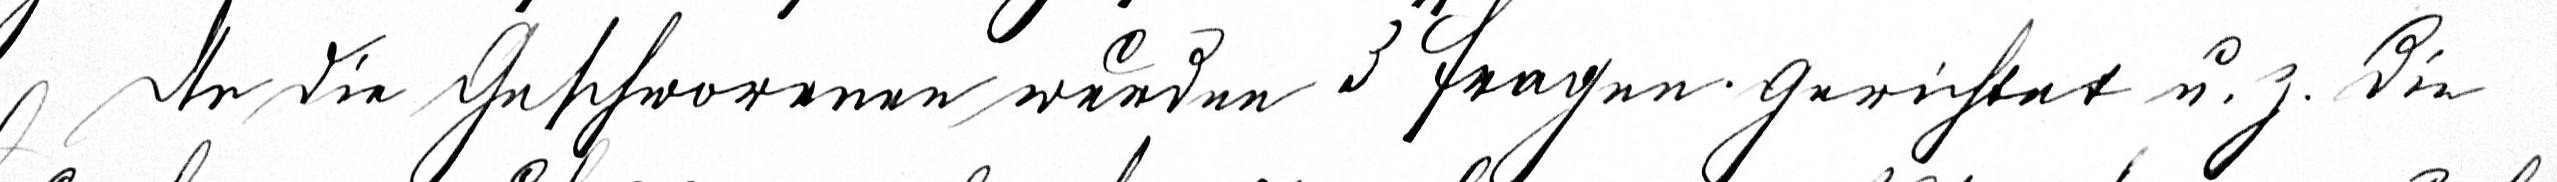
Den die Geschworenen wurden 3 Fragen Gerichtet u. z. die
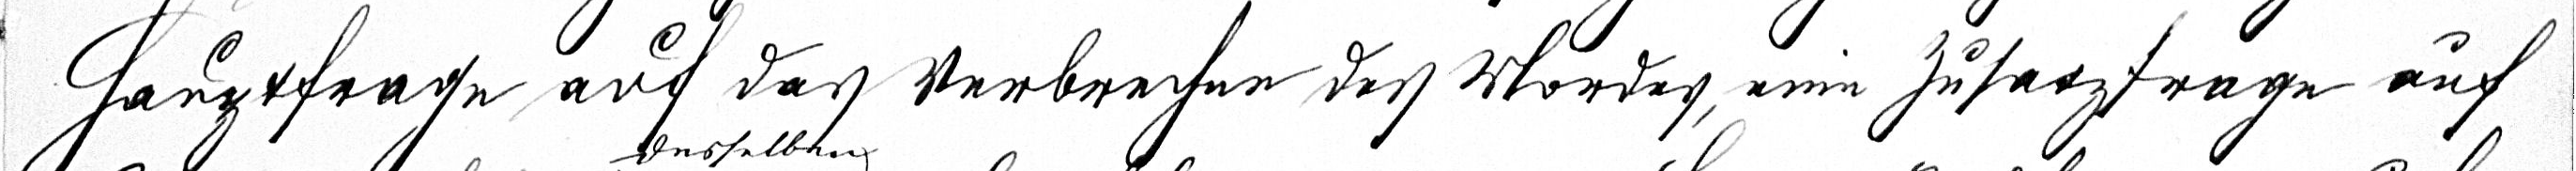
Hauptfrage auf des Verbrechen des Mordes, eine Zusatzfrage auf
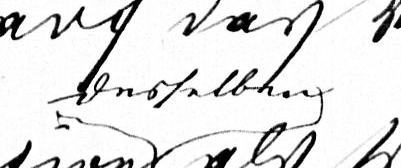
desselben
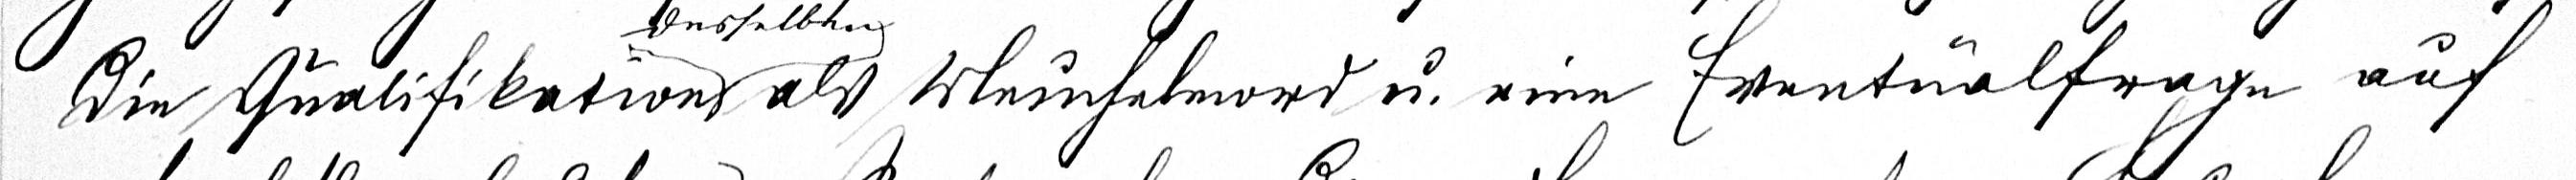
die Qualifikation als Meuchelmord u. eine Eventualfrage auf
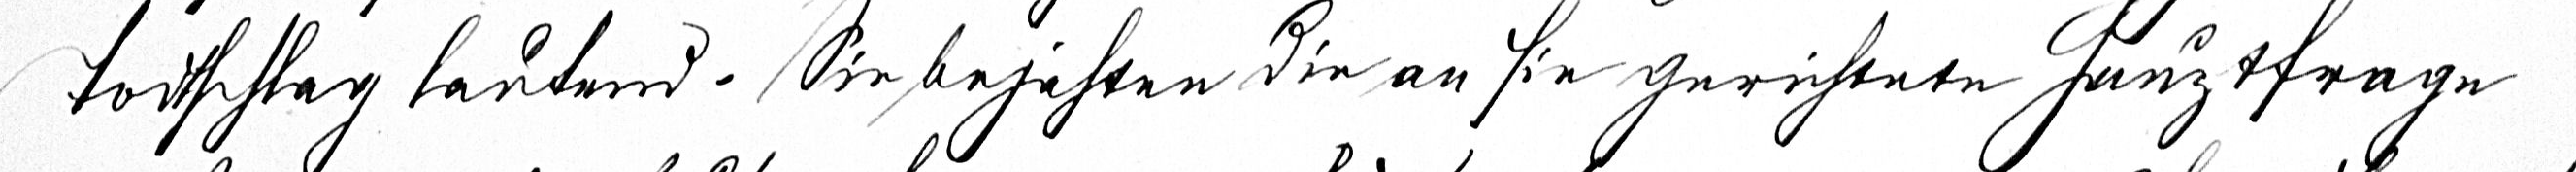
Todtschlag lautend. Sie bejahten die an sie gerichtete Hauptfrage
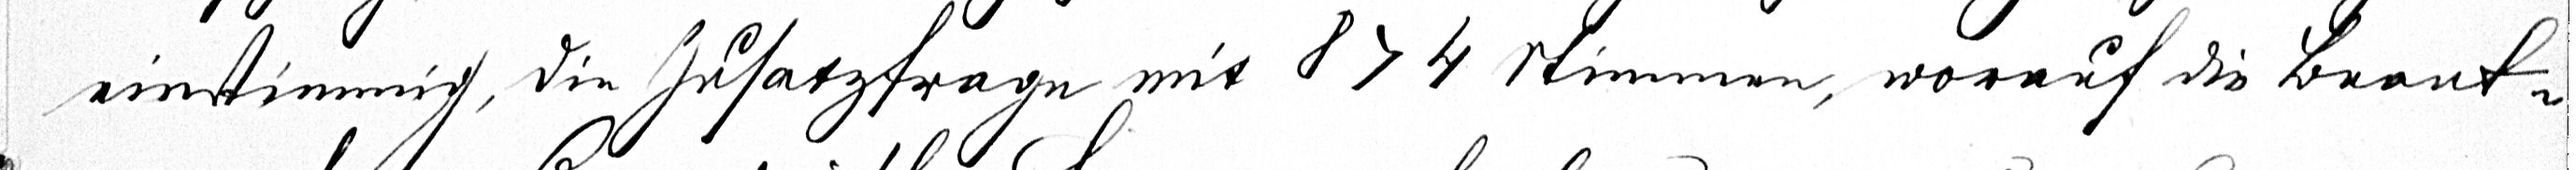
einstimmig, die Zusatzfrage mit 8>4 Stimmen, worauf die Beant¬
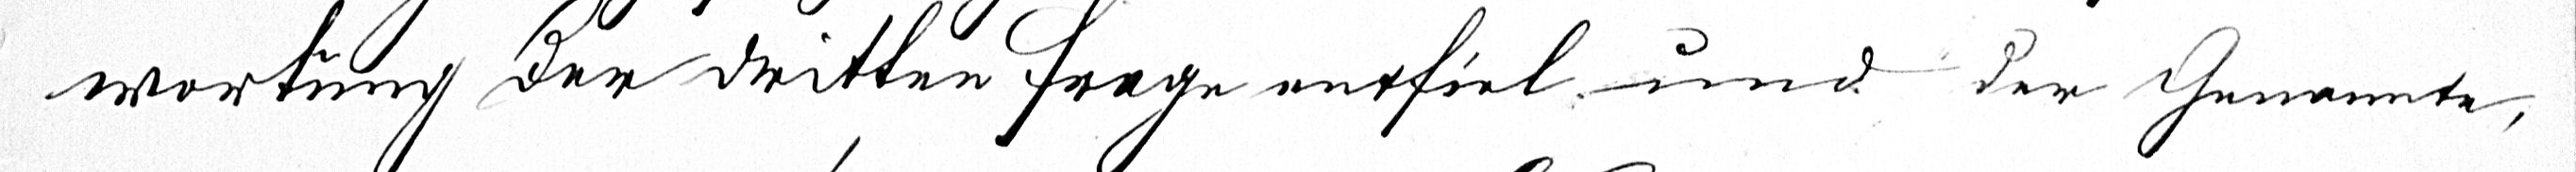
wortung der dritten Frage entfiel und der Genannte,
